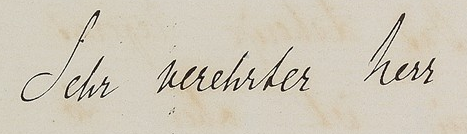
Sehr verehrter Herr
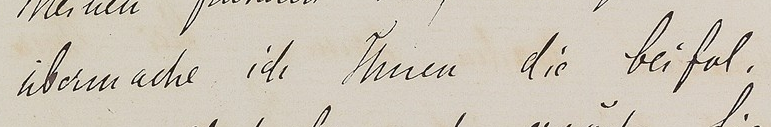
übermache ich Ihnen die beifol-
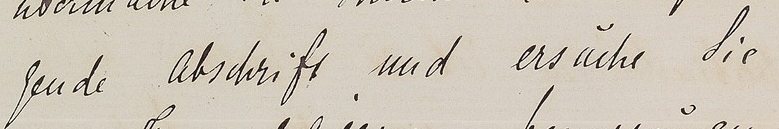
gende Abschrift und ersuche Sie
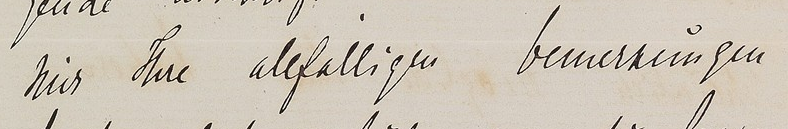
mir Ihre allfälligen Bemerkungen
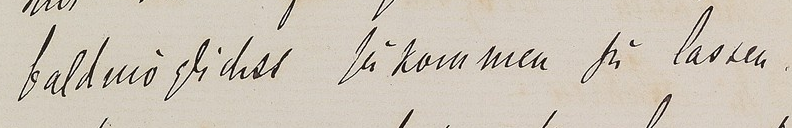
baldmöglichst zukommen zu lassen.
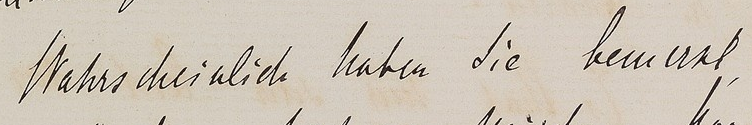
Wahrscheinlich haben Sie bemerkt,
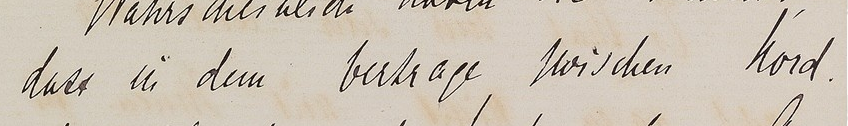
dass in dem Vertrage zwischen Nord-
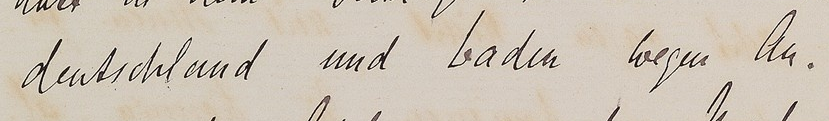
deutschland und Baden wegen An-
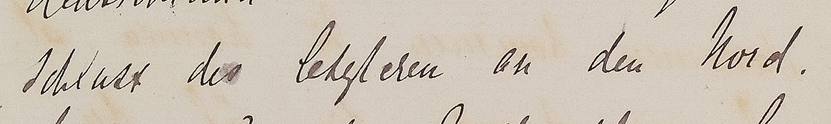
schluss des letzteren an den Nord-
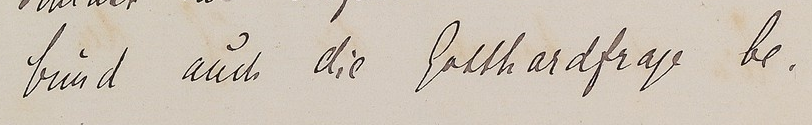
bund auch die Gotthardfrage be-
